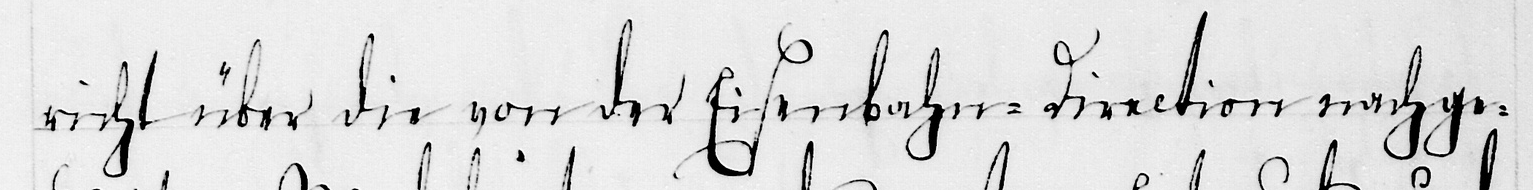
richt über die von der Eisenbahn-Direction nachge¬
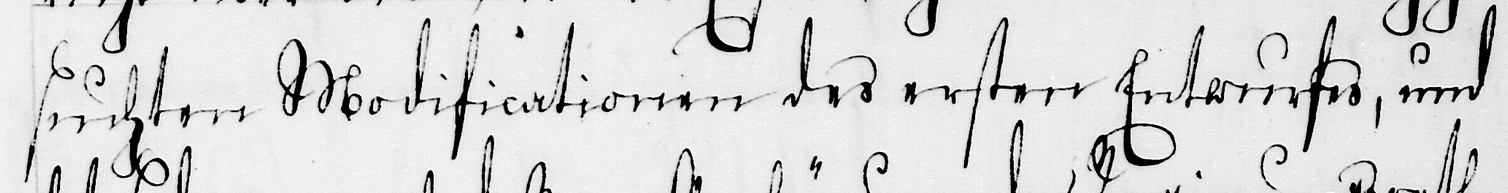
suchten Modificationen des ersten Entwurfes, und
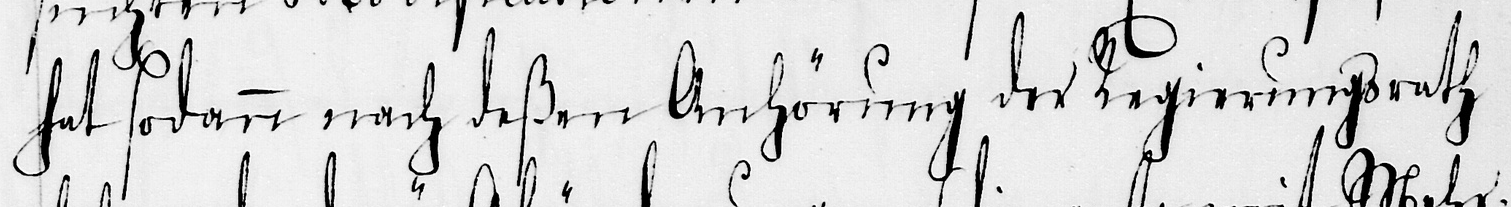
hat sodann nach deßen Anhörung der Regierungsrath
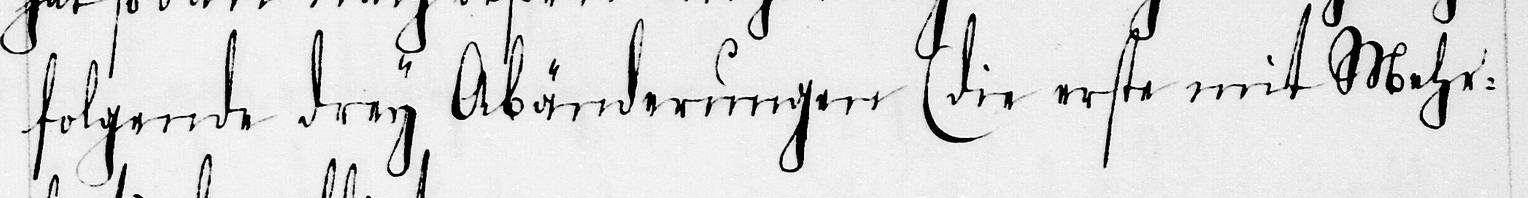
folgende drey Abänderungen (die erste mit Mehr¬
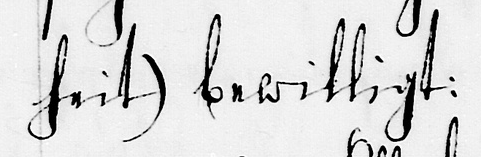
heit) bewilligt:
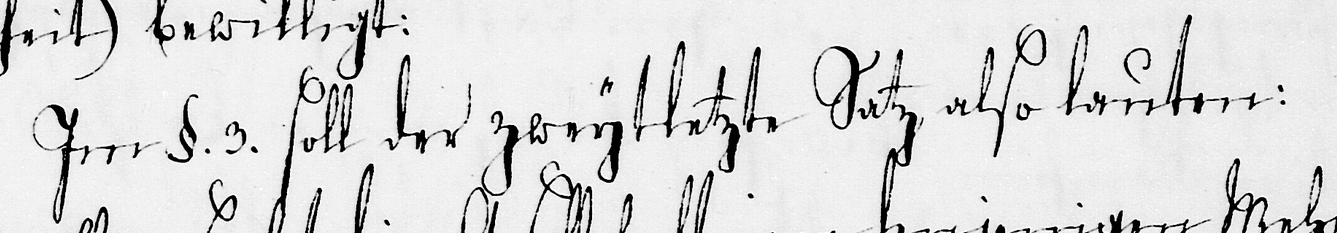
Im §. 3. soll der zweytletzte Satz also lauten:
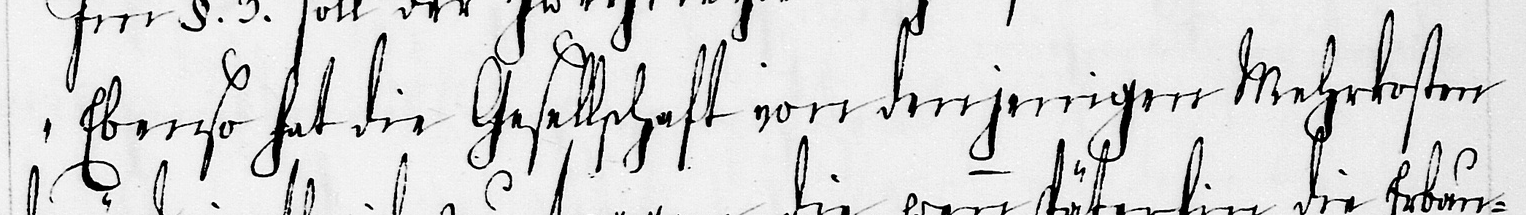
„Ebenso hat die Gesellschaft von denjenigen Mehrkosten
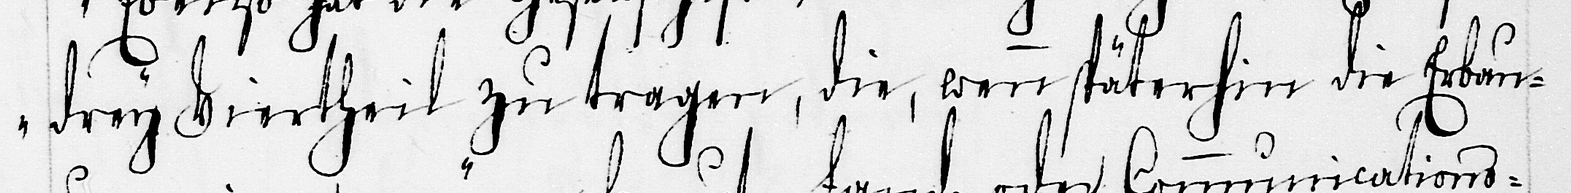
drey Viertheil zu tragen, die, wenn späterhin die Erbau¬
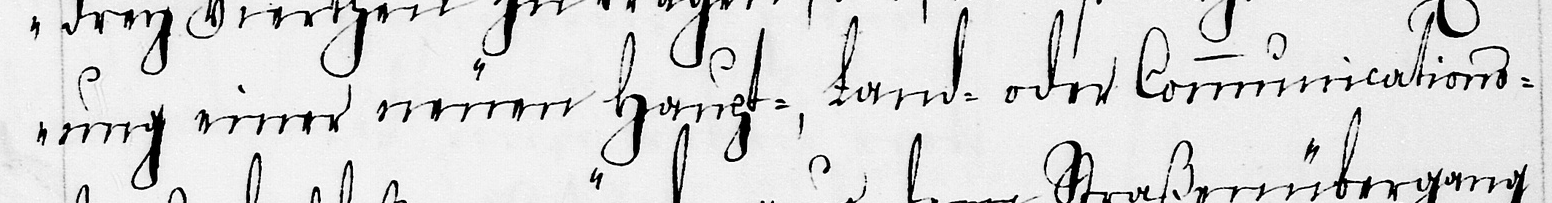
ung einer neuen Haupt-, Land- oder Communications¬
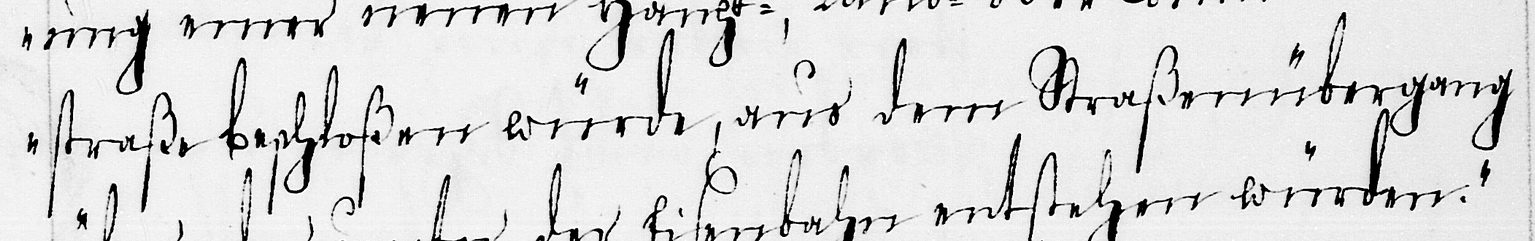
straße beschloßen würde, aus dem Straßenübergang
